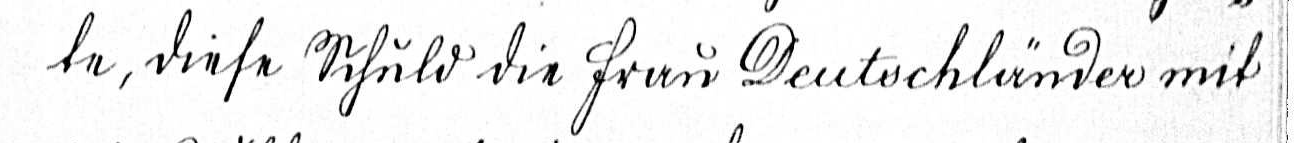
te, diese Schuld die Frau Deutschländer mit
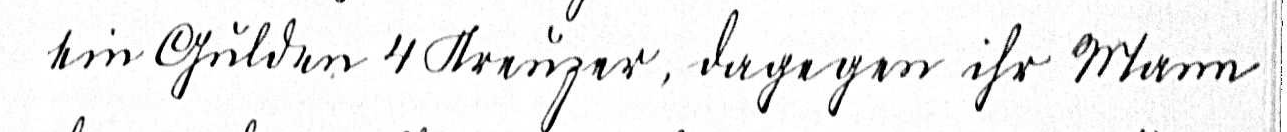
ein Gulden 4 Kreuzer, dagegen ihr Mann
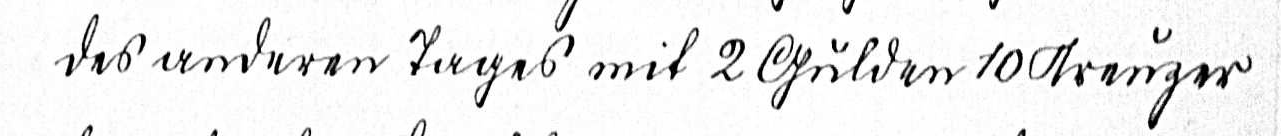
des anderen Tages mit 2 Gulden 10 Kreuzer
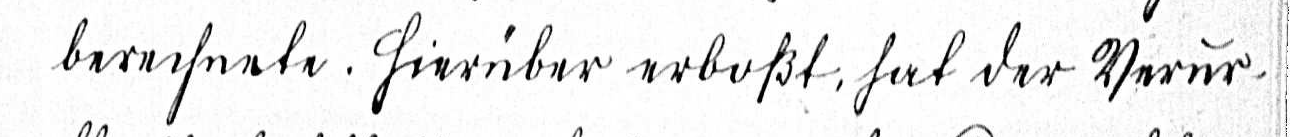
berechnete. Hierüber erboßt, hat der Verur¬
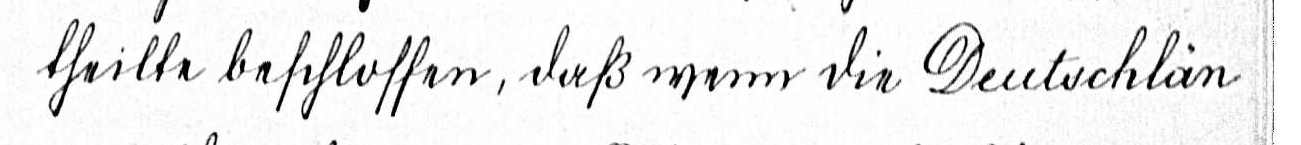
theilte beschlossen, daß wenn die Deutschlän¬
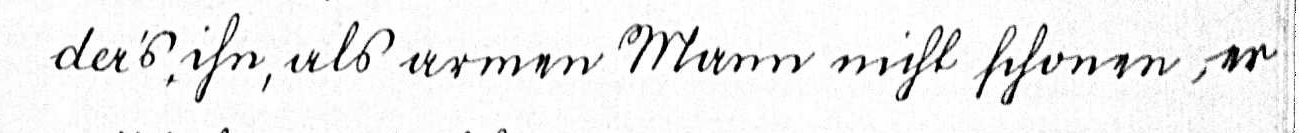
der’s ihn, als armen Mann nicht schonen, er
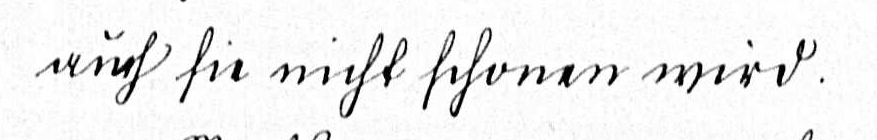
auch sie nicht schonen wird.
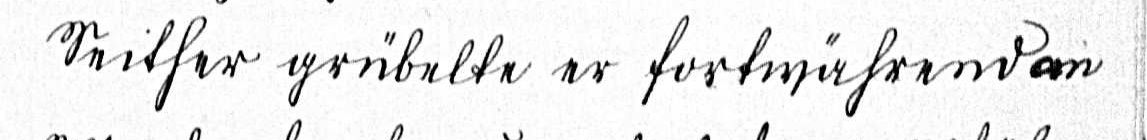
Seither grübelte er fortwährend an
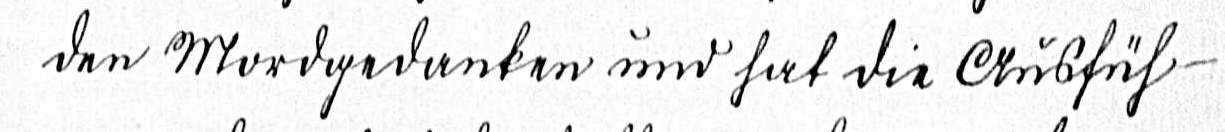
den Mordgedanken und hat die Ausfüh¬
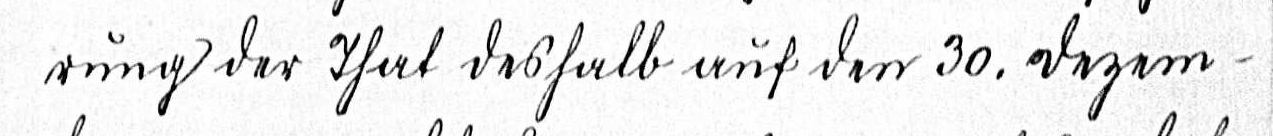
rung der That deshalb auf den 30. Dezem¬
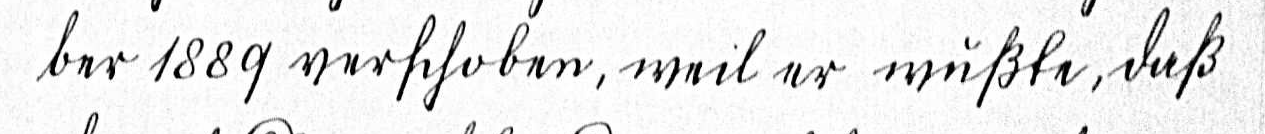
ber 1889 verschoben, weil er wußte, daß
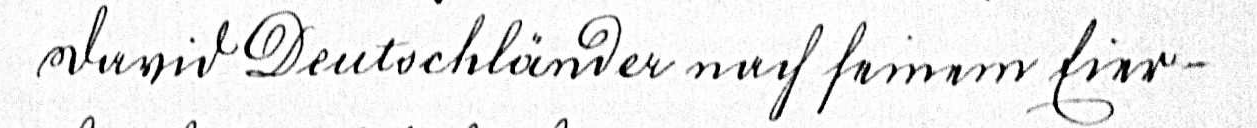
David Deutschländer nach seinem Eier¬
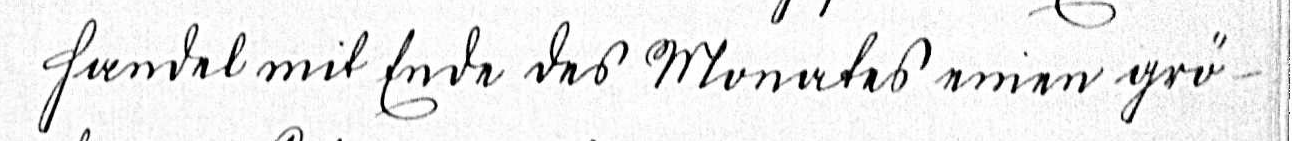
handel mit Ende des Monates einen grö¬
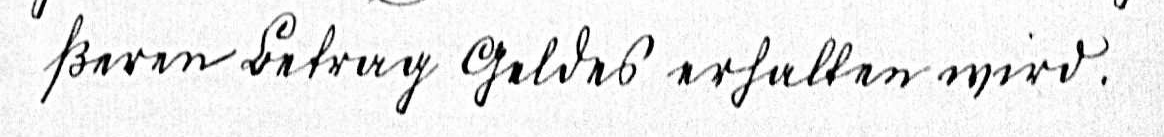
ßeren Betrag Geldes erhalten wird.
